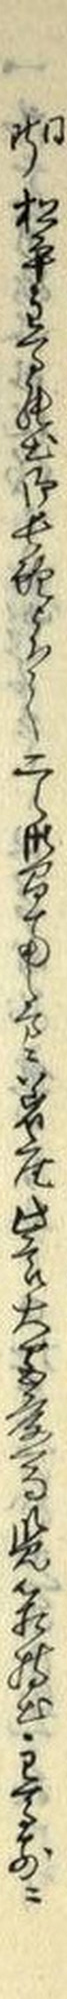同断松平主馬方罷出御長鮑被下之二之御間南之方ニ着座此節大宮藤馬覧箱持出主馬前ニ
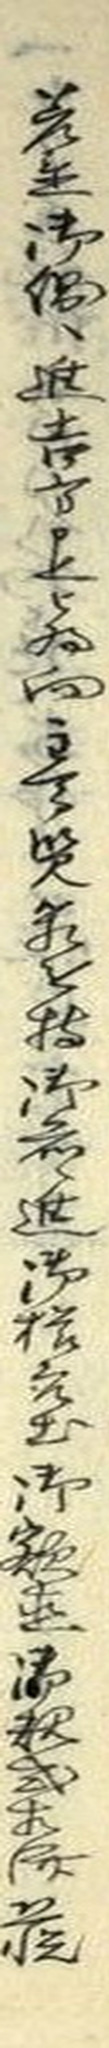差置御側へ進吉方申上被為向主馬覧箱を持御前へ進御櫛取出御額直御規式相済恐悦
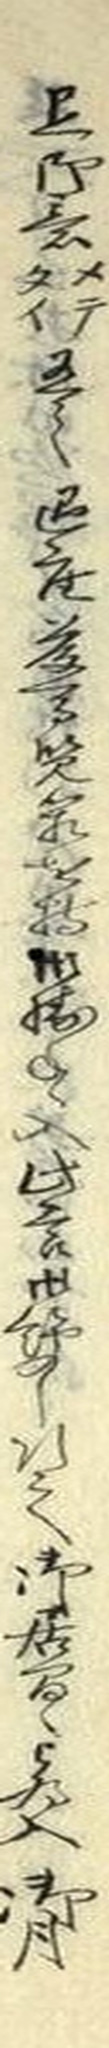タイ有之退座藤馬覧箱を持御勝手へ入此節御飾のし引之御居間へ被為入御月
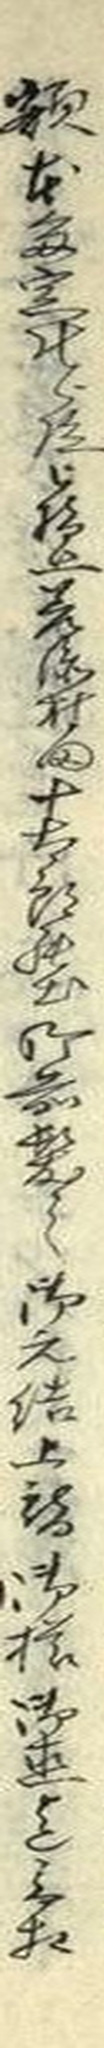額本多定次郎殿被指上差添村田十太郎罷出御前髪之御元結上替御櫛御直迄ニ而相
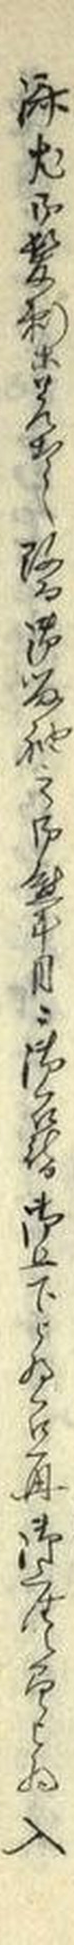済尤御髪刺等差出之改而御留袖之御熨斗目ニ御召替御上下被為召再御座之間へ被為入
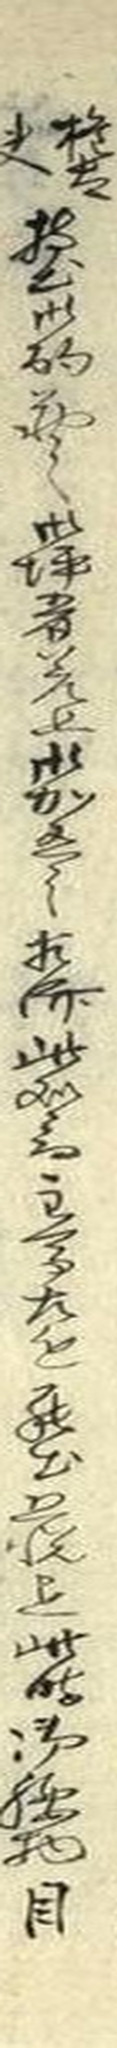夫持出御酌勤之御挟肴差上御加有之相済此処ニ而主馬左近罷出恐悦申上此時御腰物目
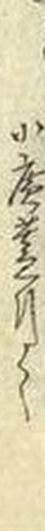小広蓋引之
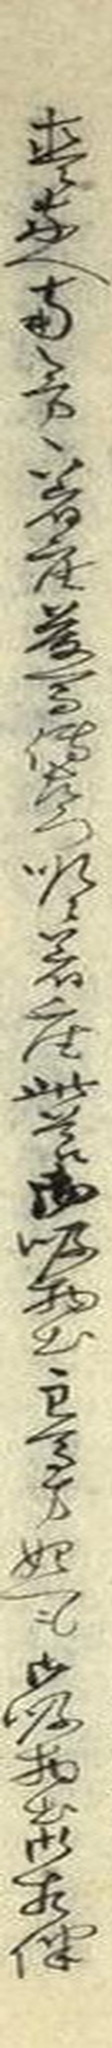直ニ両人南之方へ着座藤馬伝左衛門順ニ着座此節御吸物出主馬方始へも御吸物出御相伴
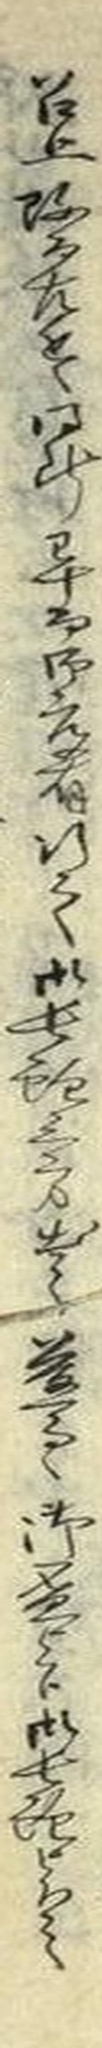召上改而左近へ同断畢而御取肴引之御長鮑三方出之藤馬へ御盃被下御長鮑被下之

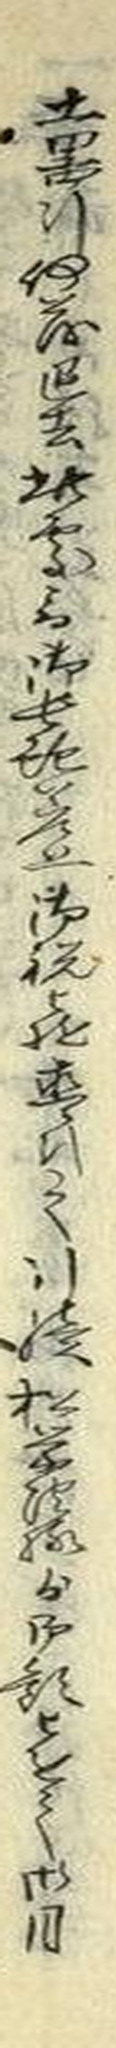土器引何茂退去此処ニ而御長鮑差上御祝被遊直ニ引之引続松栄院様ゟ御歓被進之御目
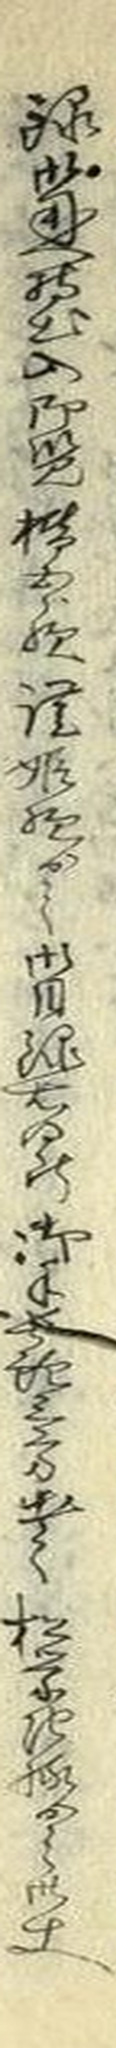録御用人持出入御覧楷五郎様謹姫様ゟ之御目録右同断御手長鮑三方出之松栄院様ゟ之御使
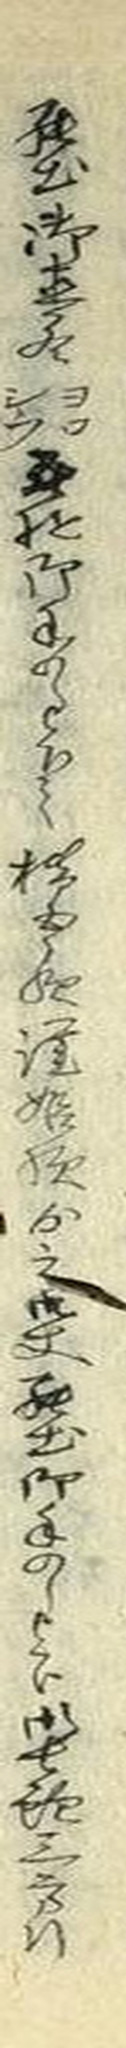シク被遊御手のし被下之楷五郎様謹姫様ゟ之御使罷出御手のし被下御長鮑三方引
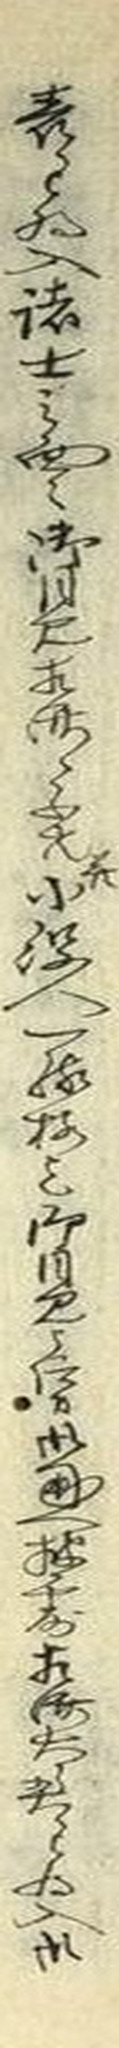表へ被為入諸士之面々御目見相済候子共幷小役人一統格迄御目見被仰付御用人披露相済大奥へ被為入御
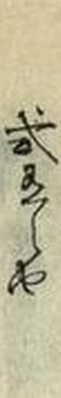式有之由
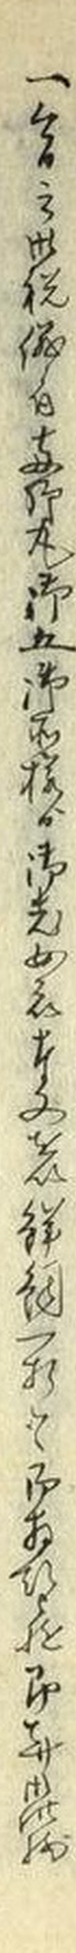一今日之御祝儀ニ付両御丸御五御所様ゟ御老女衆奉文を以鮮鯛一折ツヽ御拝領被遊即刻御供揃
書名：少傅日録抄（斉善付側向頭取日記、在府）
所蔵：福井県文書館 Fukui Prefectural Archives
